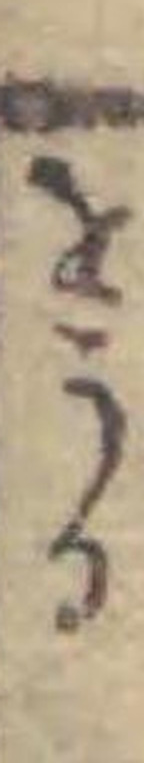をうる
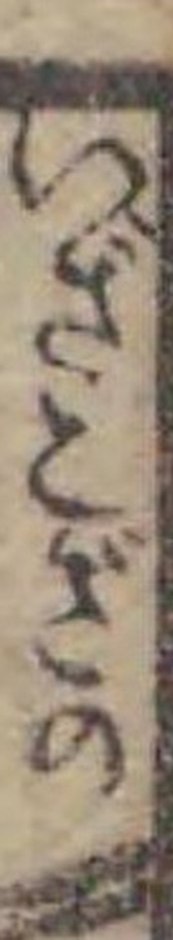いざこざの
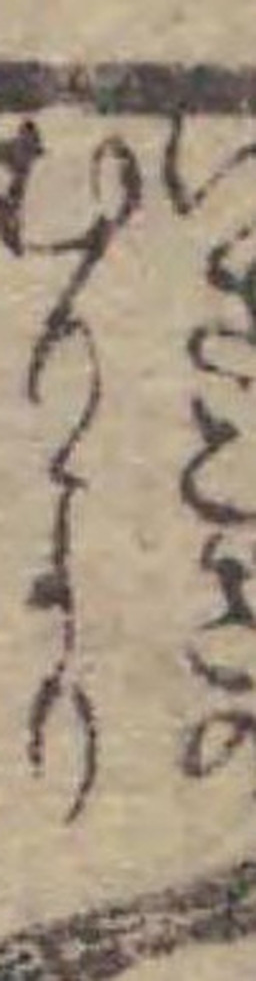むりより
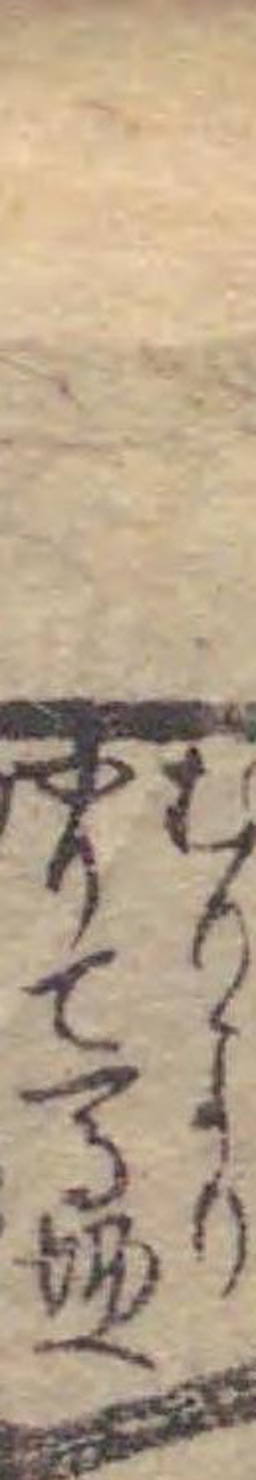やりて馬場へ
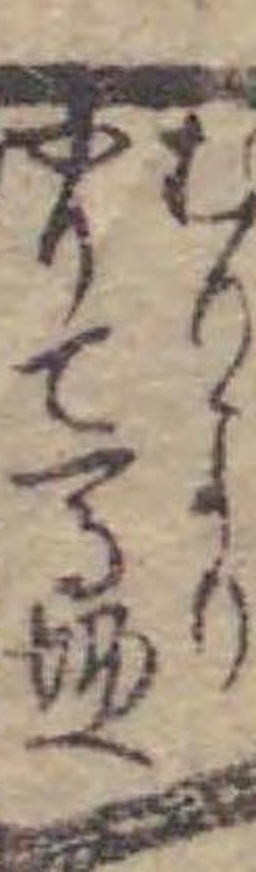やりて馬場へ
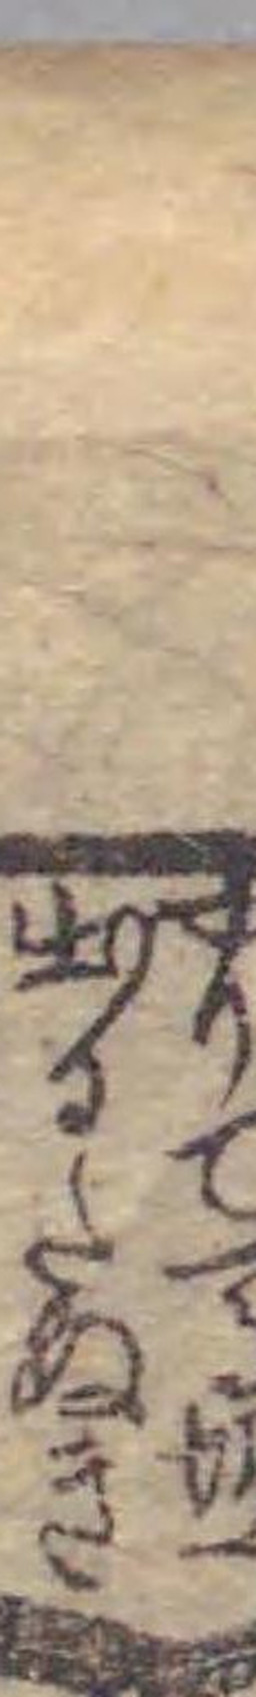出るたぬき
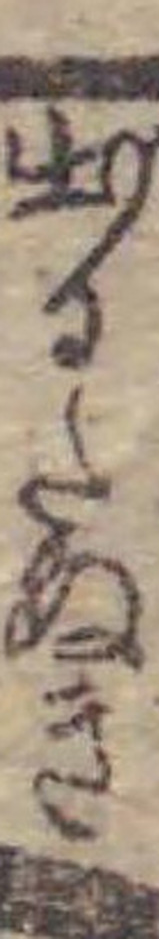出るたぬき
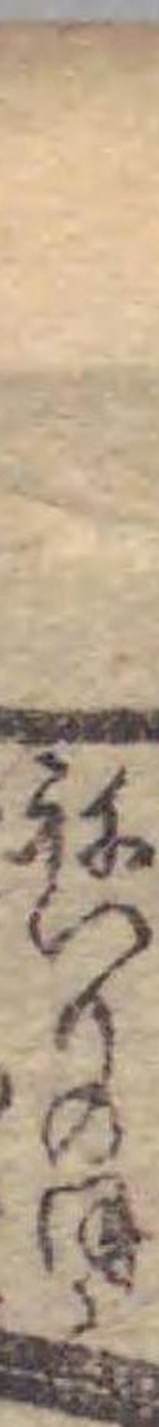ねいりのほら
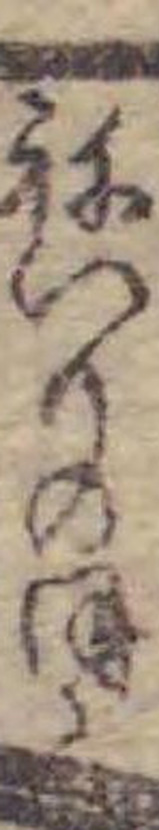ねいりのほら
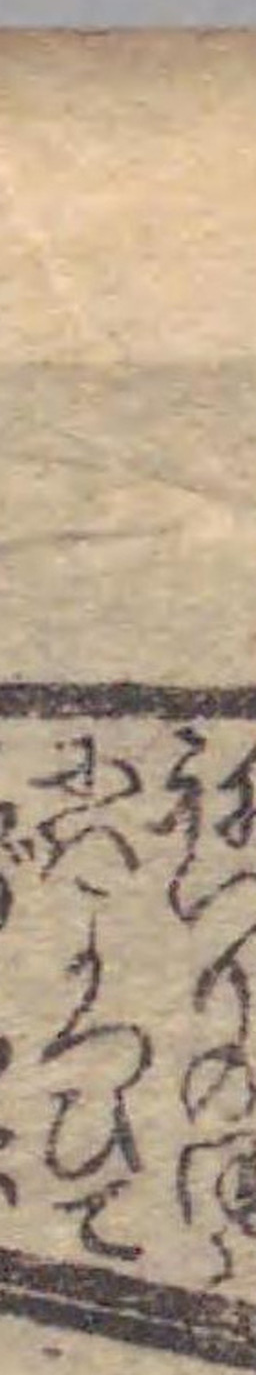にはよつひて
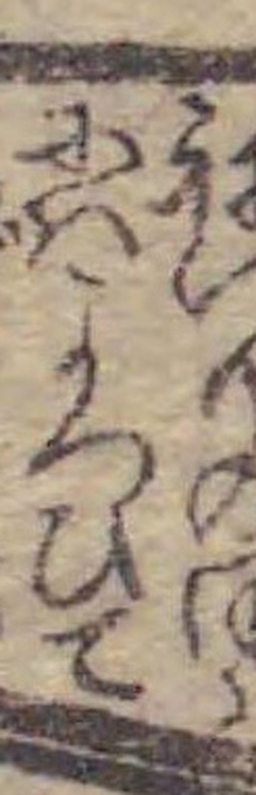にはよつひて
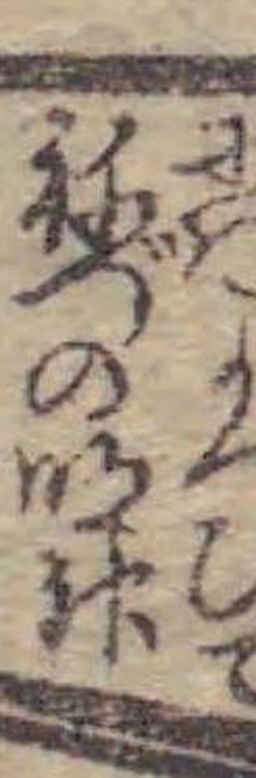ねづの明神
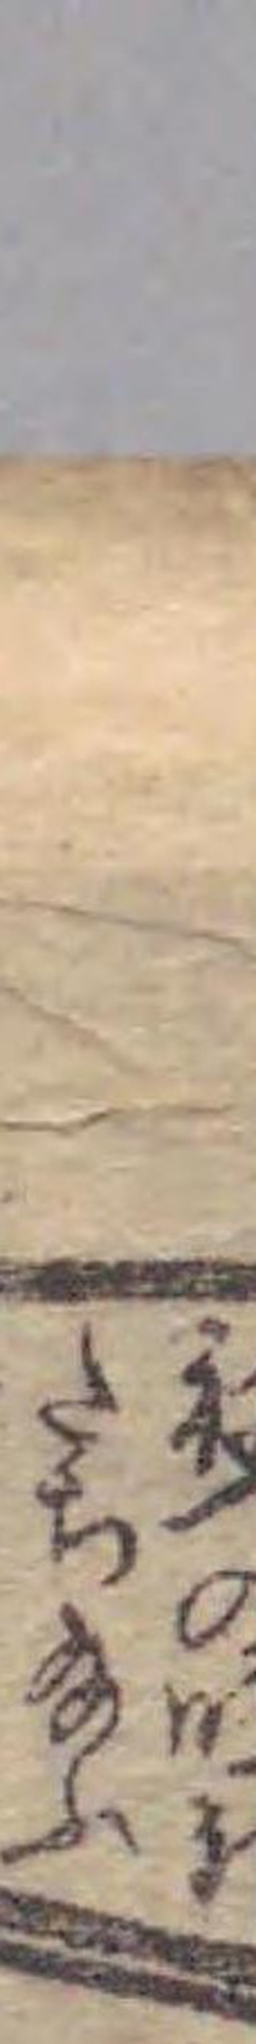たち給ふ
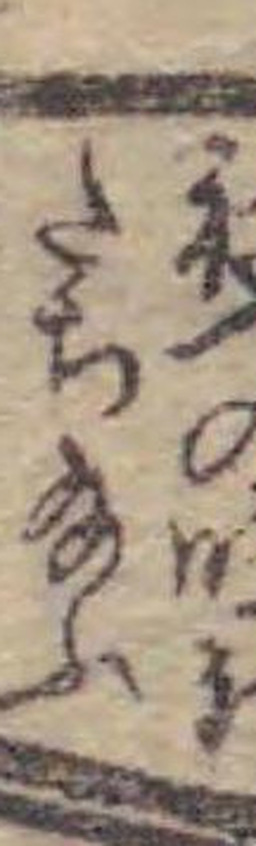たち給ふ
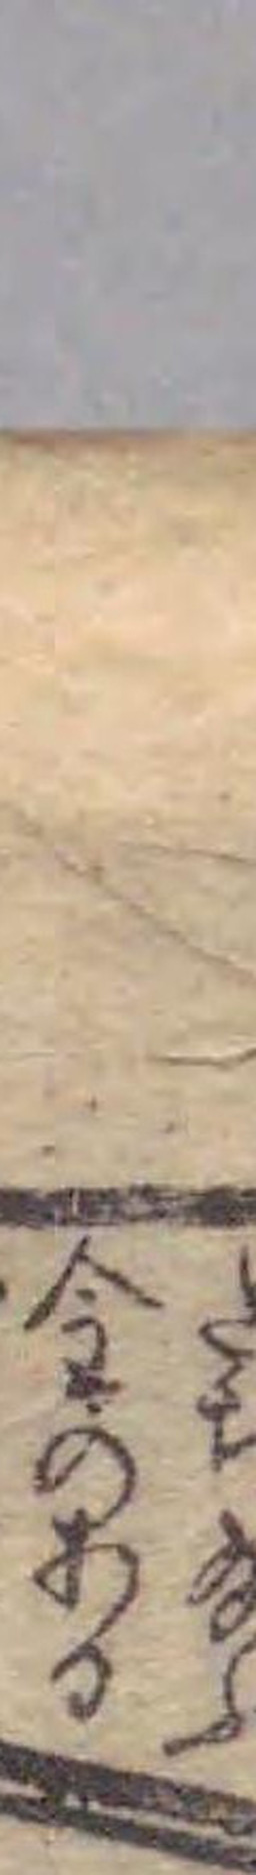金のある
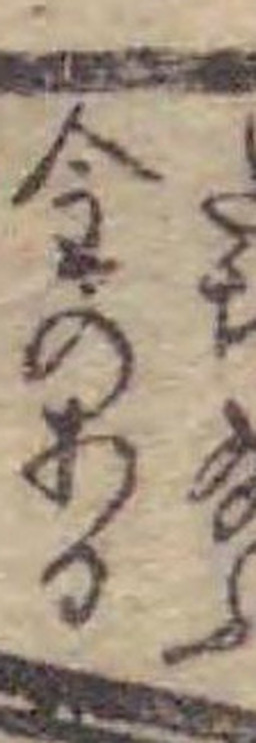金のある
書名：北国順礼唄方便 : 3巻
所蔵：国立国会図書館 National Diet Library, JAPAN
